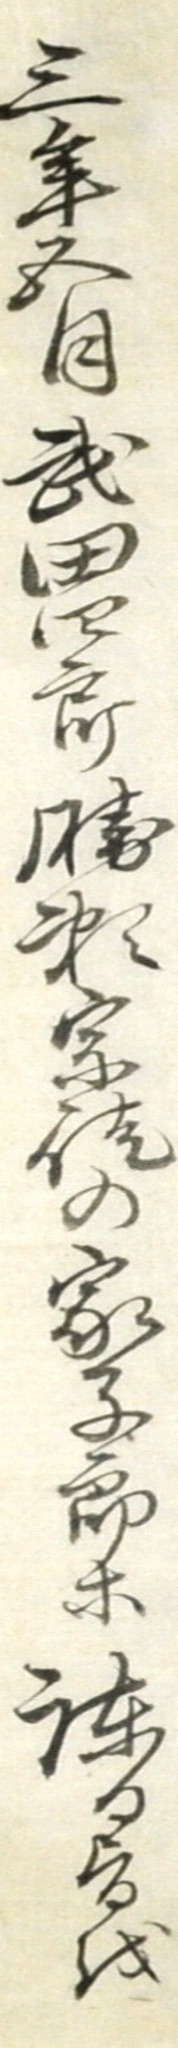三年五月武田四郎勝頼宗徒の家子郎等諫る旨を
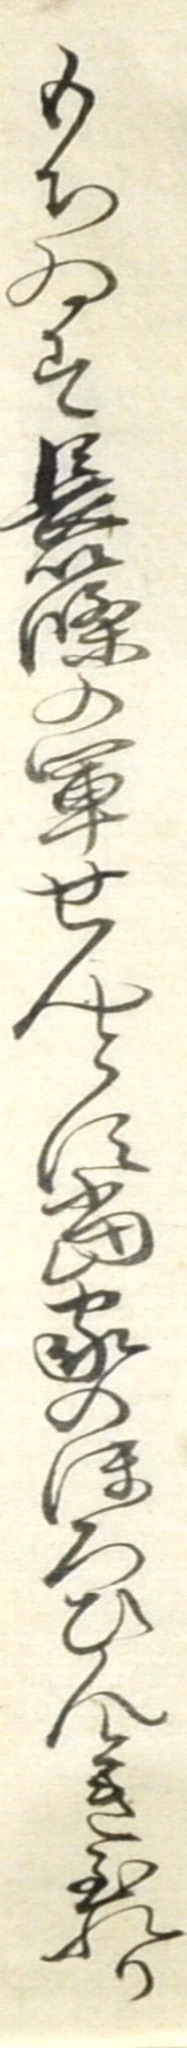もちゐす長篠の軍せんとす当家のほろひんとき至れり
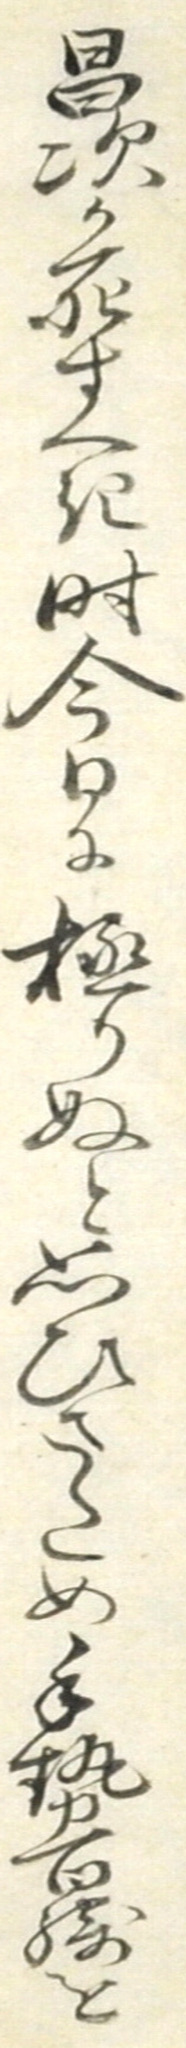昌次か死すへき時今日に極りぬと思ひさため手勢百騎を
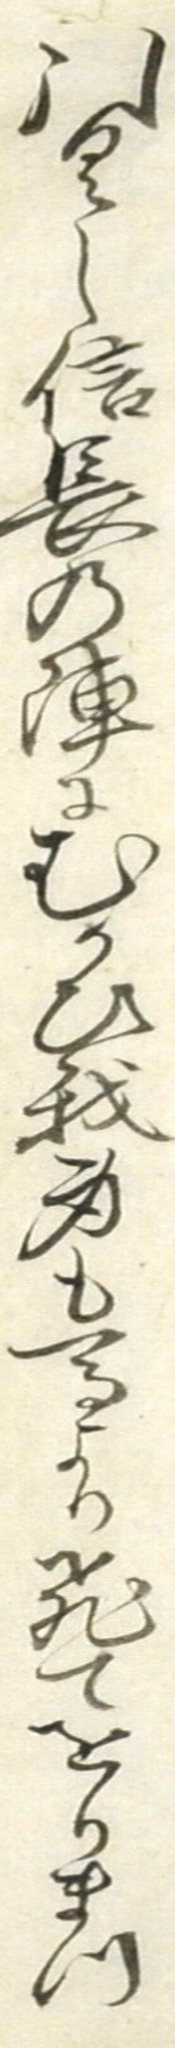引具し信長の陣にむかひ我身も馬より飛てをりまつ
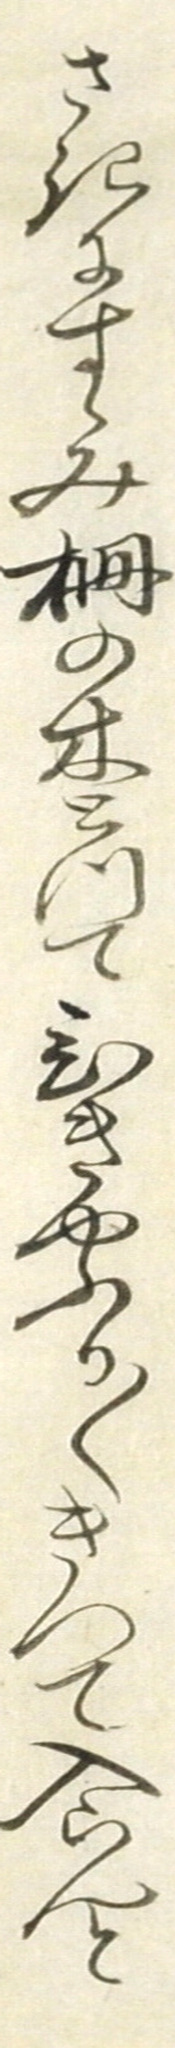さきにすゝみ柵の木とつてひきやふり〳〵きつて入らんと
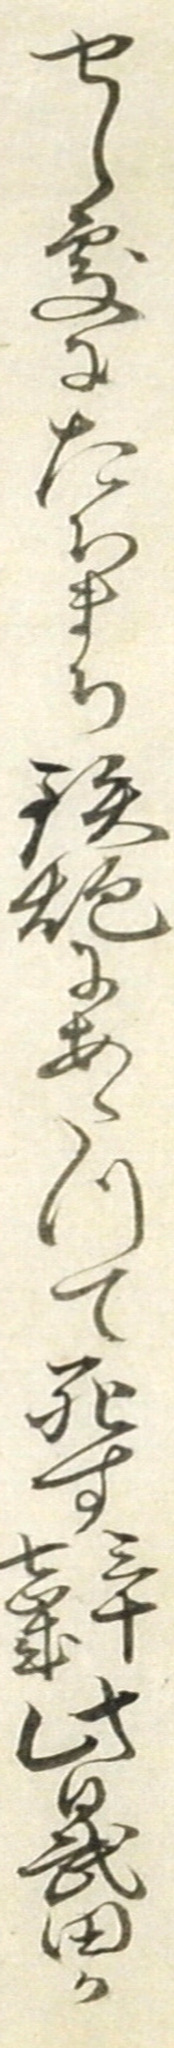せし処にたちまち鉄炮にあたつて死す三十七歳此日武田か
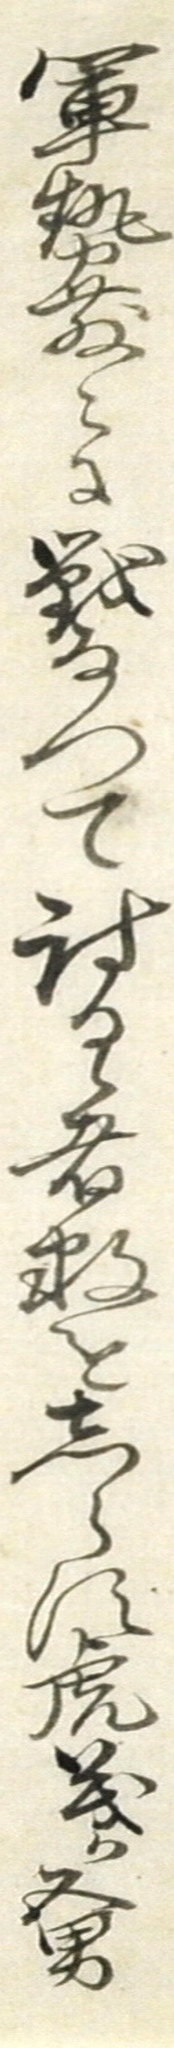軍勢散々に戦なつて討るゝ者数をしらす虎義か五男
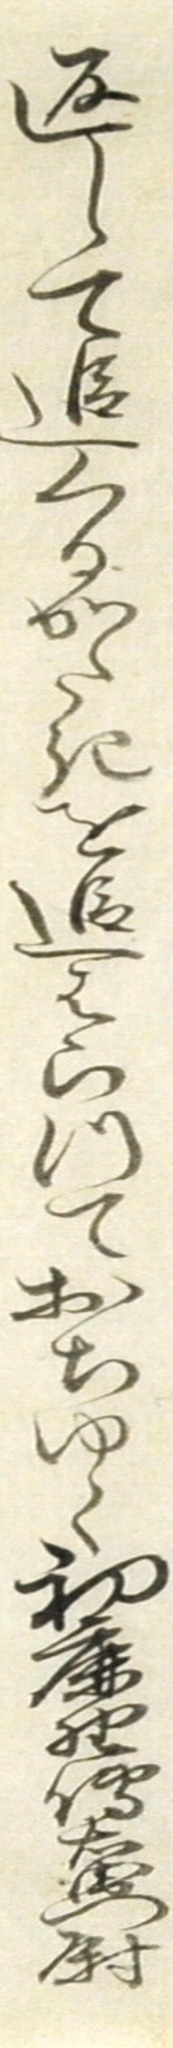返して追くるかたきを追はらつておちゆく初鹿野伝右衛門尉
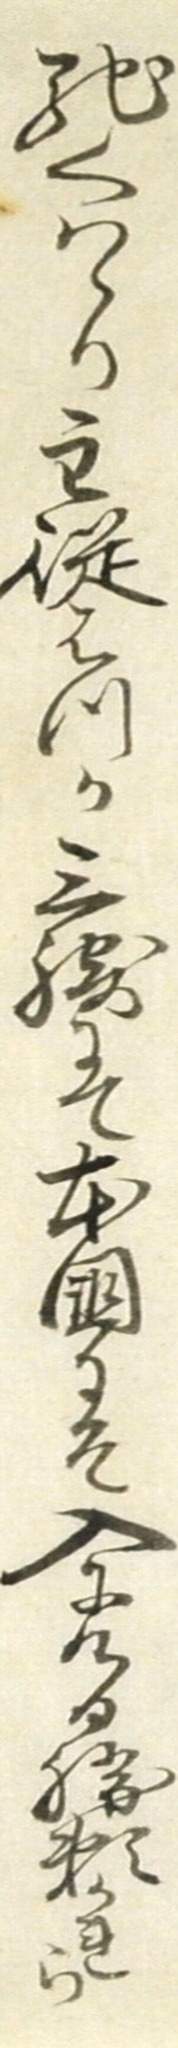馳くはゝり主従はつか三騎にて本国にそ入にける勝頼かれら
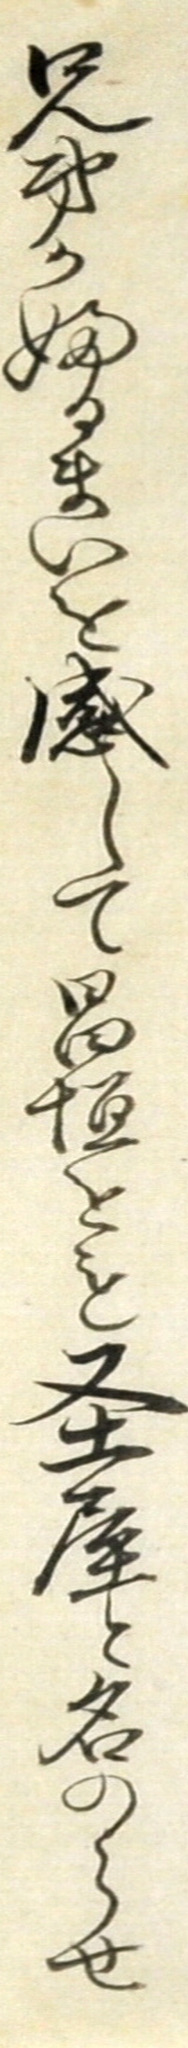兄弟かふるまいを感して昌恒をも又土屋と名のらせ

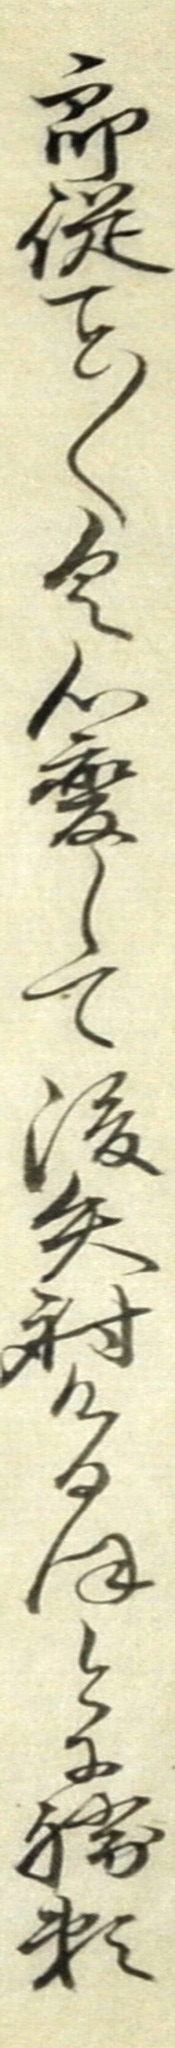郎従こと〳〵く心変して後矢射けるほとに勝頼
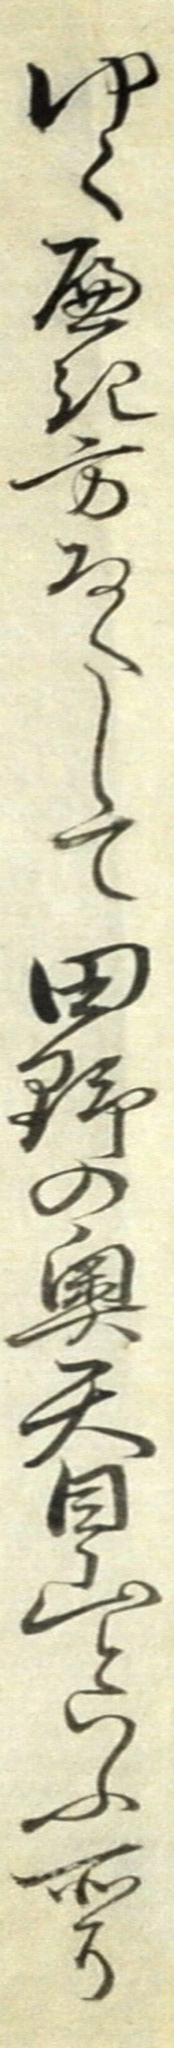ゆくへき方なくして田野の奥天目山といふ所に
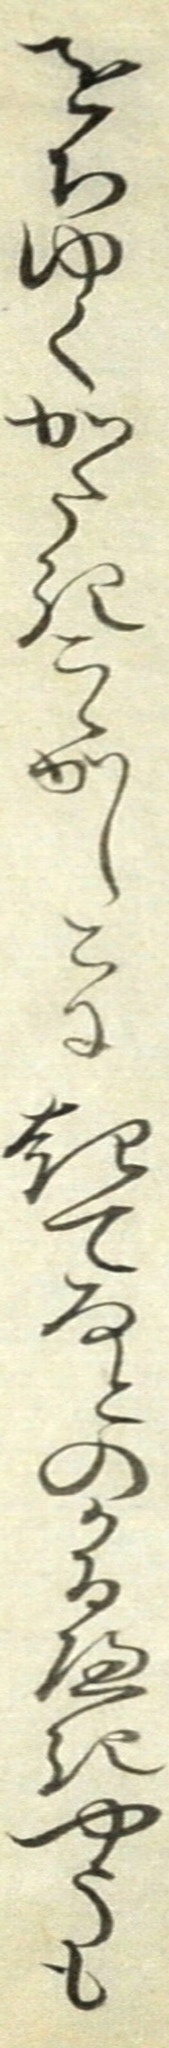をちゆくかたきこゝかしこにきてなとのかるへきやうも
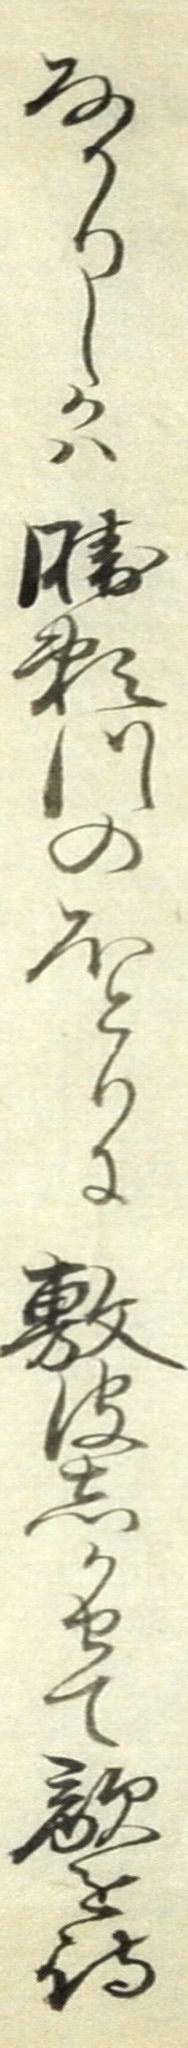なかりしかは勝頼川のほとりに敷皮しかせて敵を待
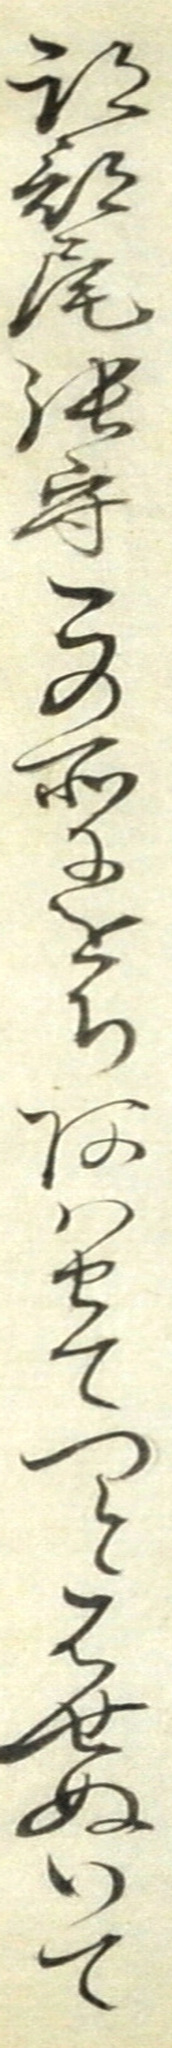跡部尾張守この所にをちあはせてつとはせぬいて
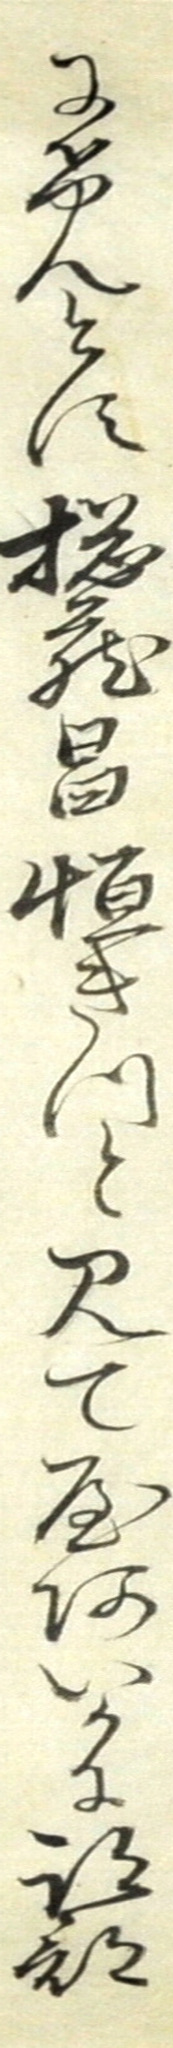にけんとす総蔵昌恒きつと見てやあいかに跡部
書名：藩翰譜（六）
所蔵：伊那市立高遠町図書館・合同会社AMANE
